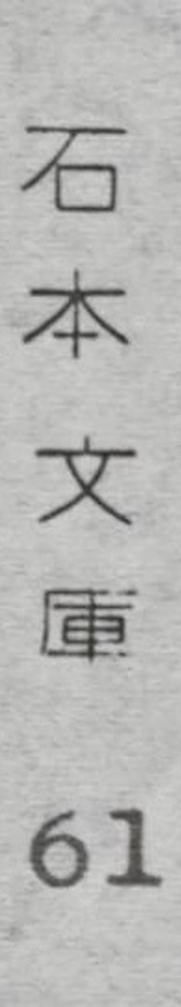石本文庫
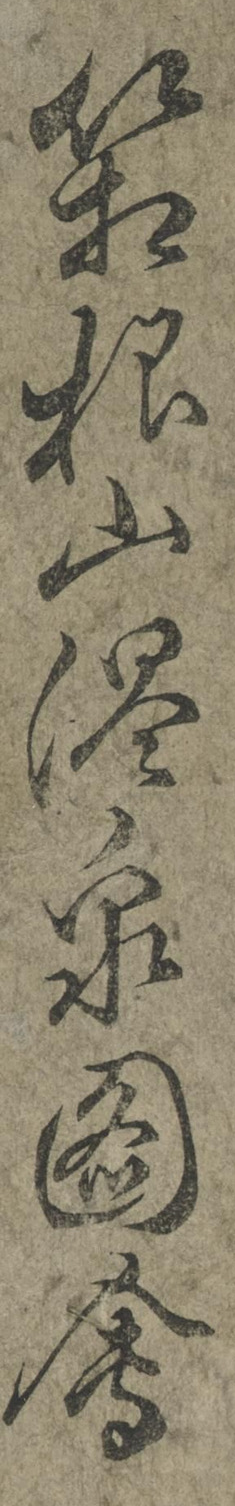箱根山温泉図会

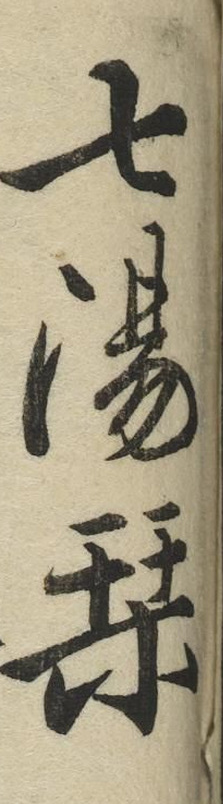七湯栞
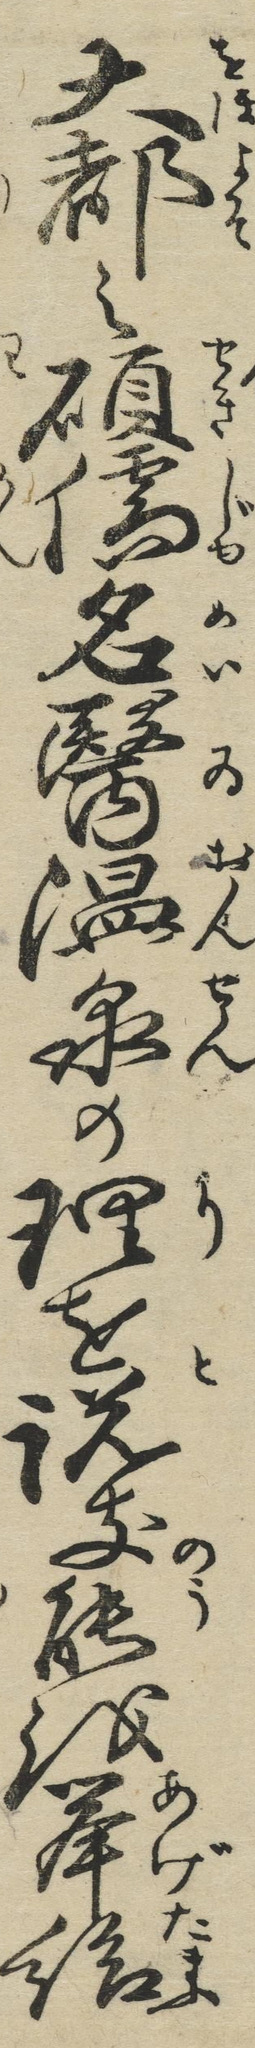大都の碩儒名医温泉の理を説き能を挙給
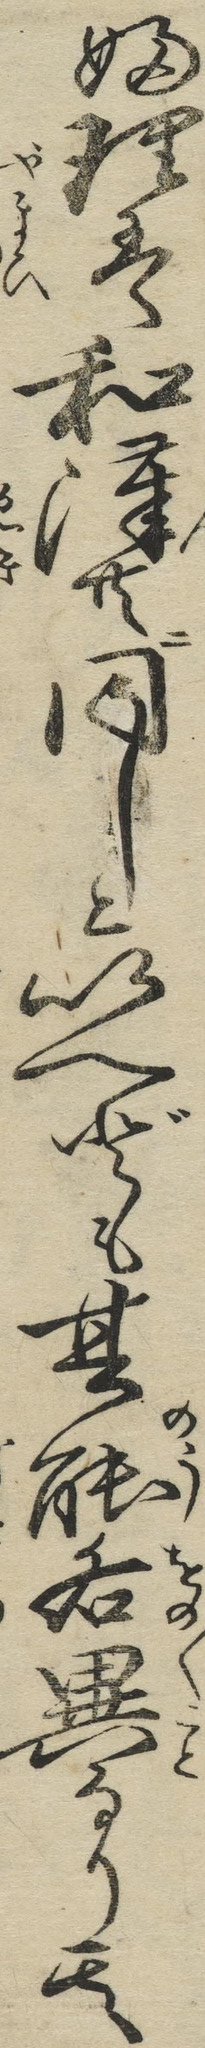ふ理は和漢共同しといへども其能各異なり其
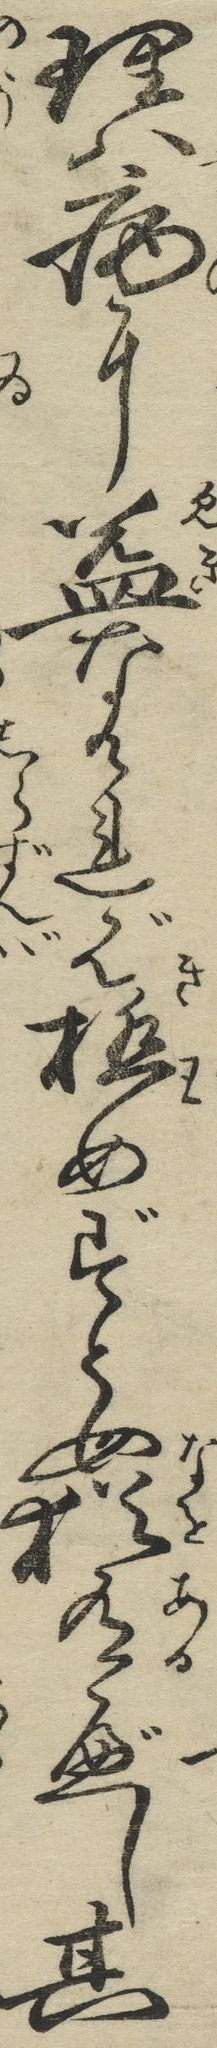理は病に益なければ極めずとも猶有べし其
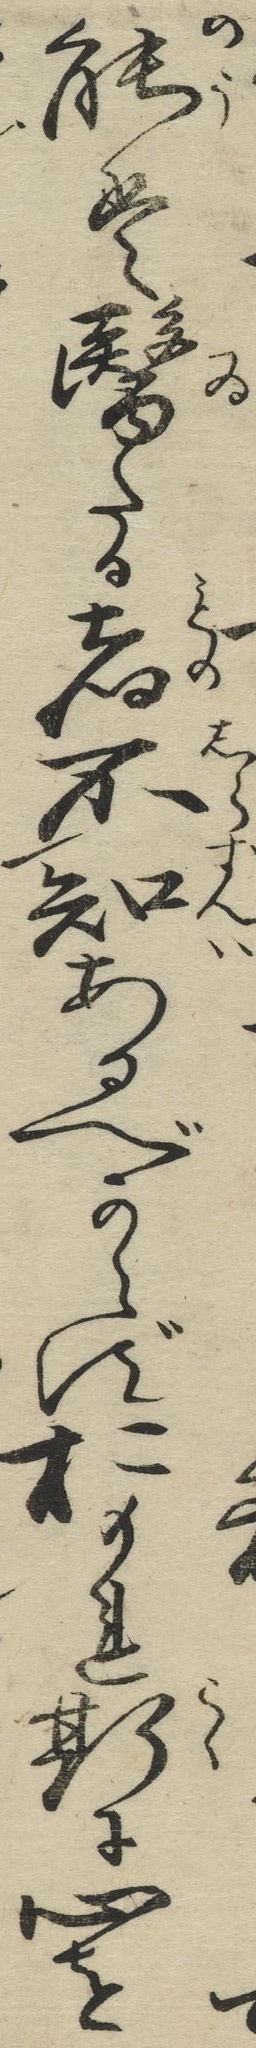能は医たる者不知あるべからずおのれ斯に心を
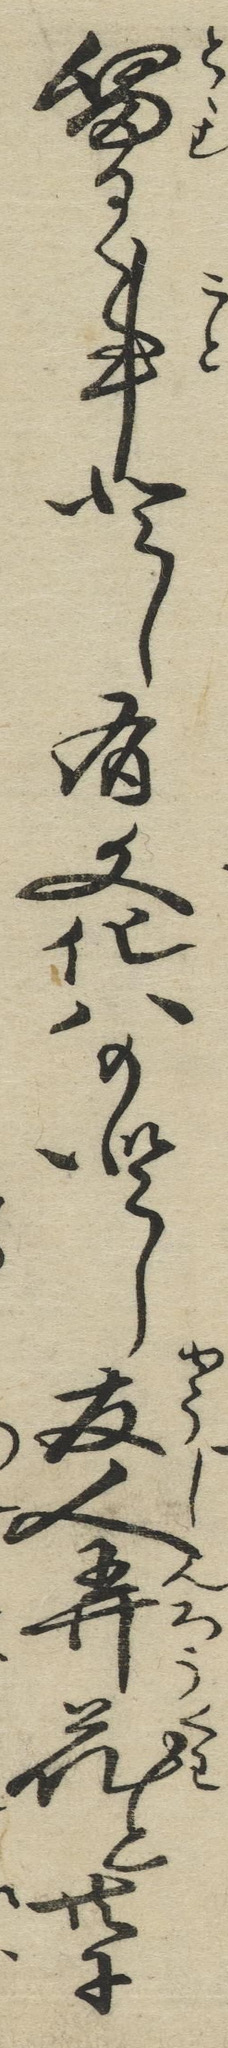留る事とし有文化八のとし友人弄花と共に
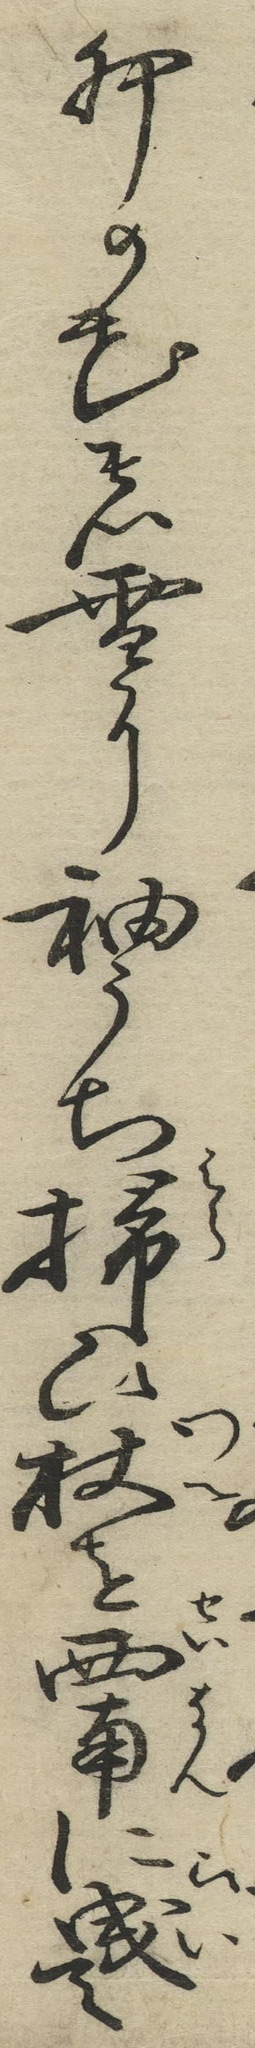卯の花の雪に袖うち掃ひ杖を西南に曳て

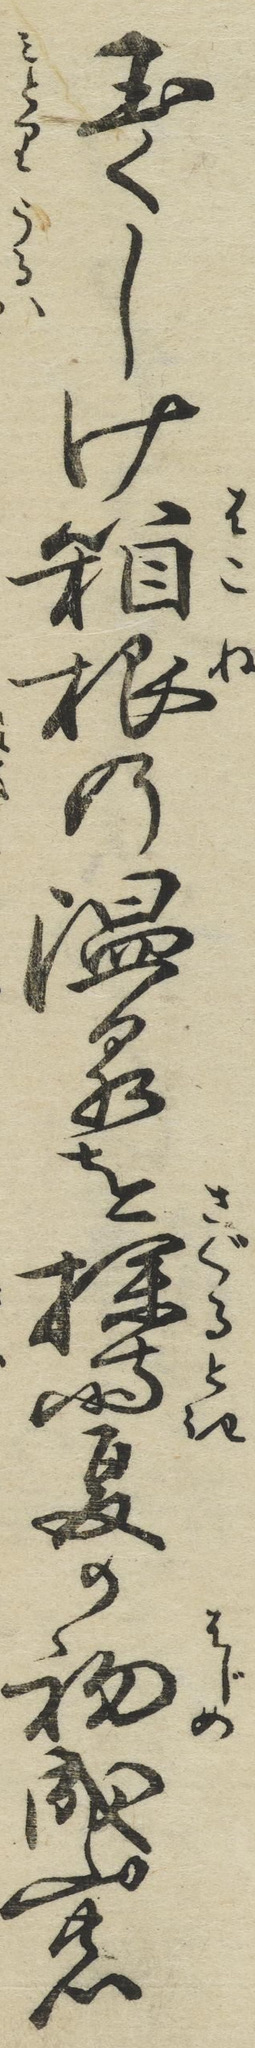玉くしけ箱根の温泉を探時夏の初成山の
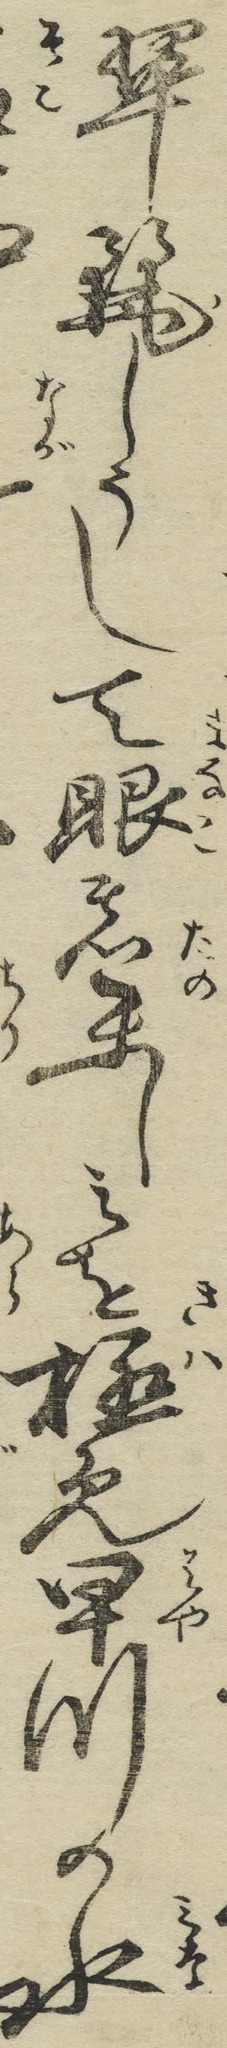翠麗しうして眼の楽しみを極め早川の水
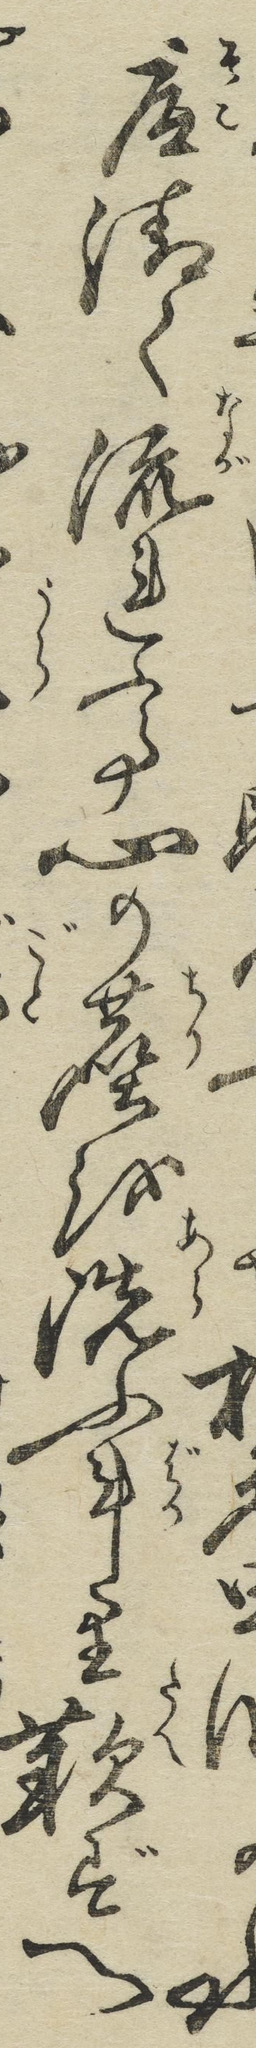底清く流れて心の塵を洗ふ斗り歎ずへ
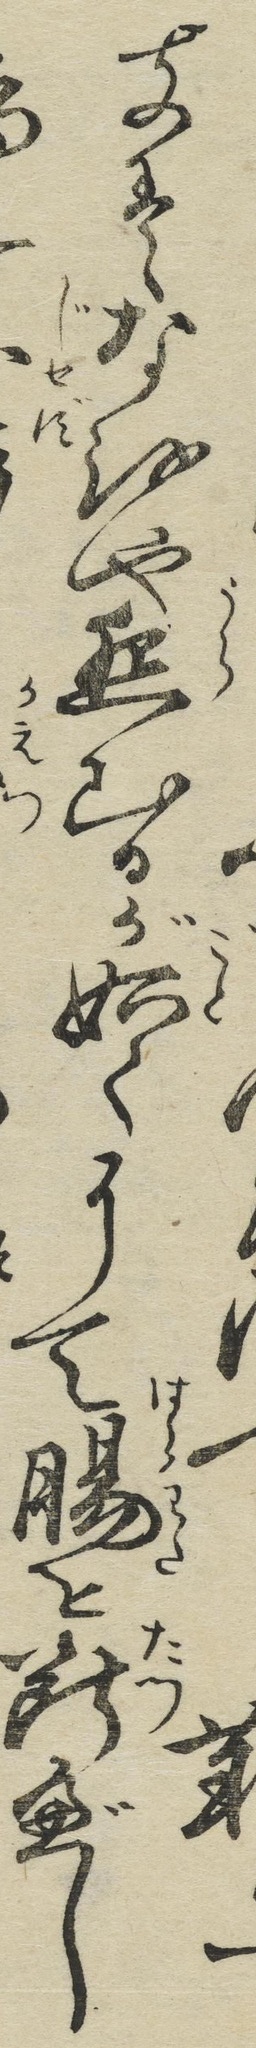きはなをや怨むるが如くにて腸を断べし
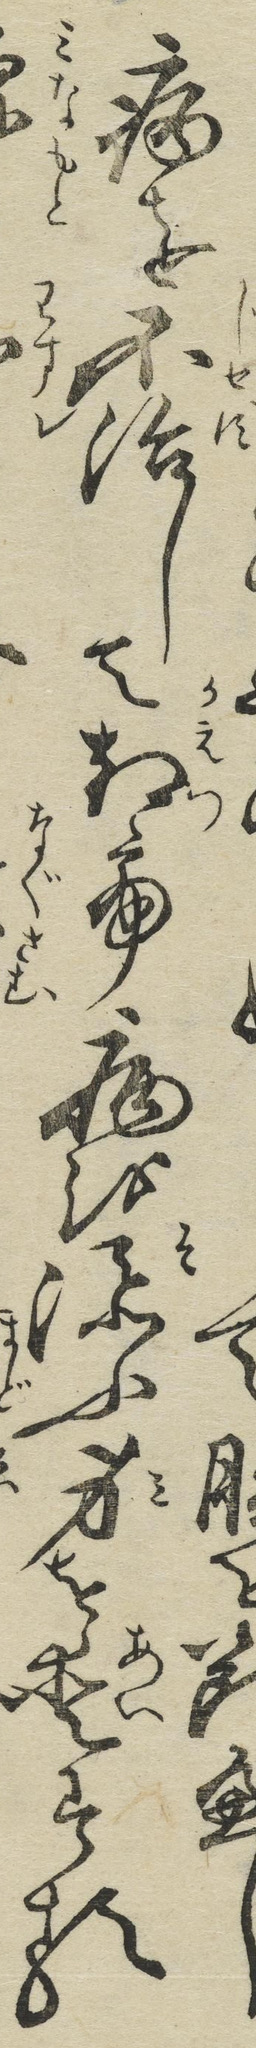病を不治して却て病を添ふ身を愛する
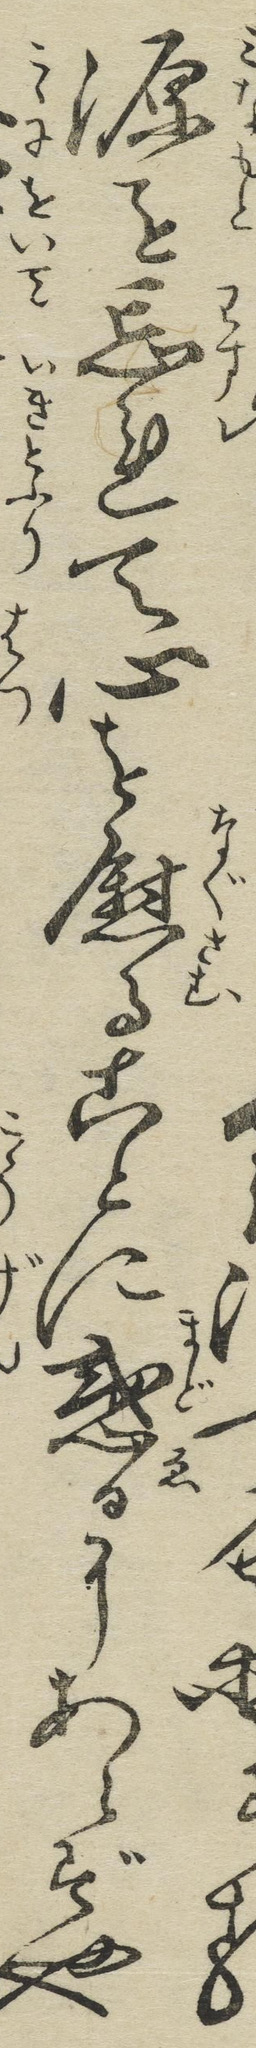源を忘れて心を慰ることに惑るにあらずや
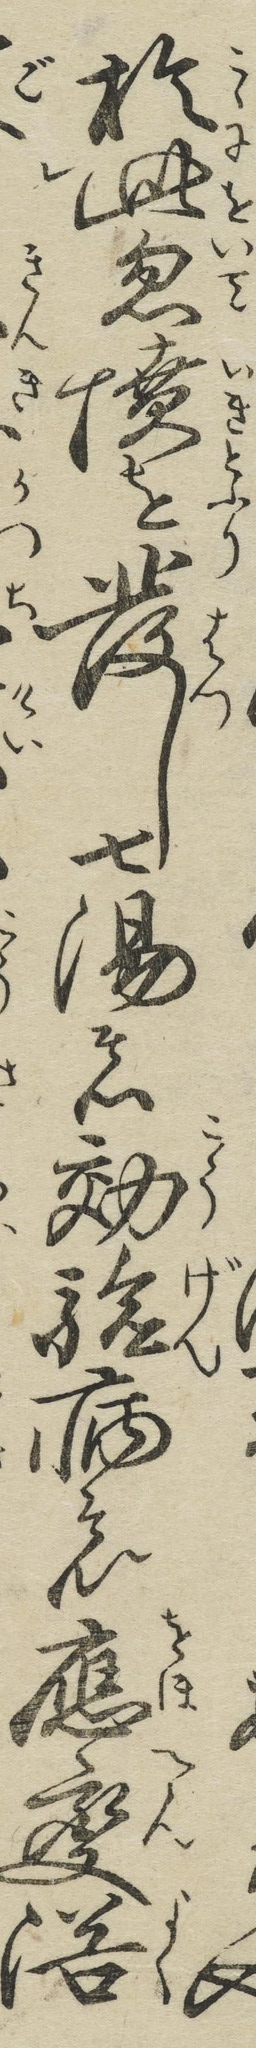於此忽憤を發し七湯の効験病の應変浴
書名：箱根七湯　温泉圖會　全
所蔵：東京大学地震研究所図書室 Earthquake Research Institute Library, The University of Tokyo, JAPAN
